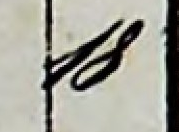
18
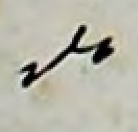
do
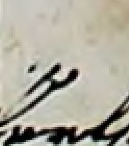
„
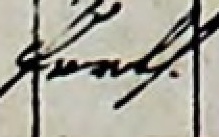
Forts.
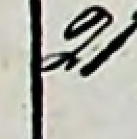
21
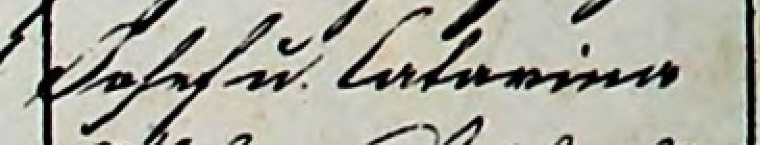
Josef u. Catarina
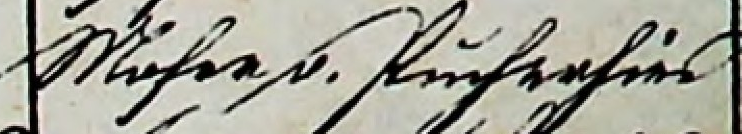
Moser v. Pucherhirs
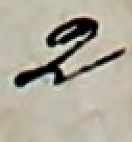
2
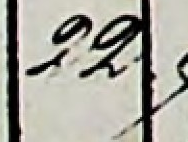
22
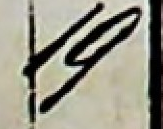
19
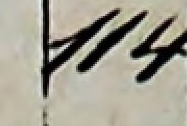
114
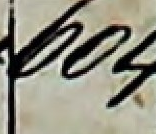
604
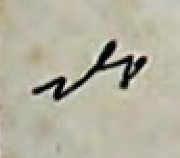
do
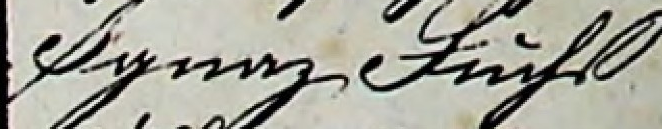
Ignaz Fuchs
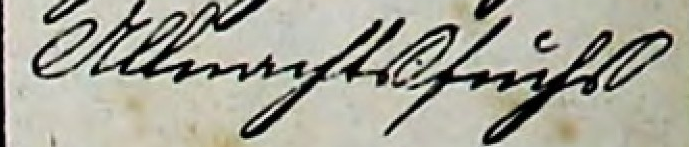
Altnachtsfuchs
